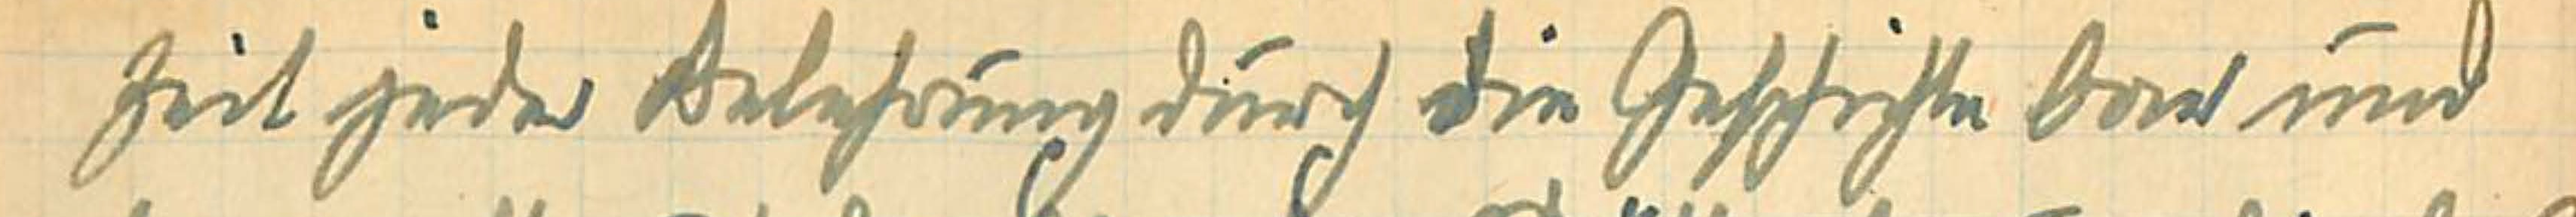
Zeit jeder Belehrung durch die Geschichte bar und
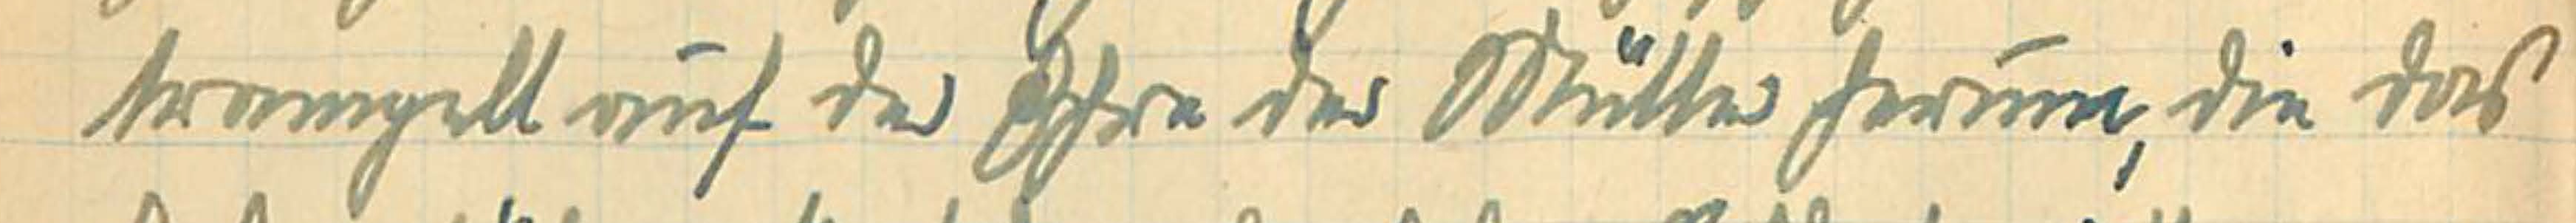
trampelt auf der Ehre der Mütter herum, die das
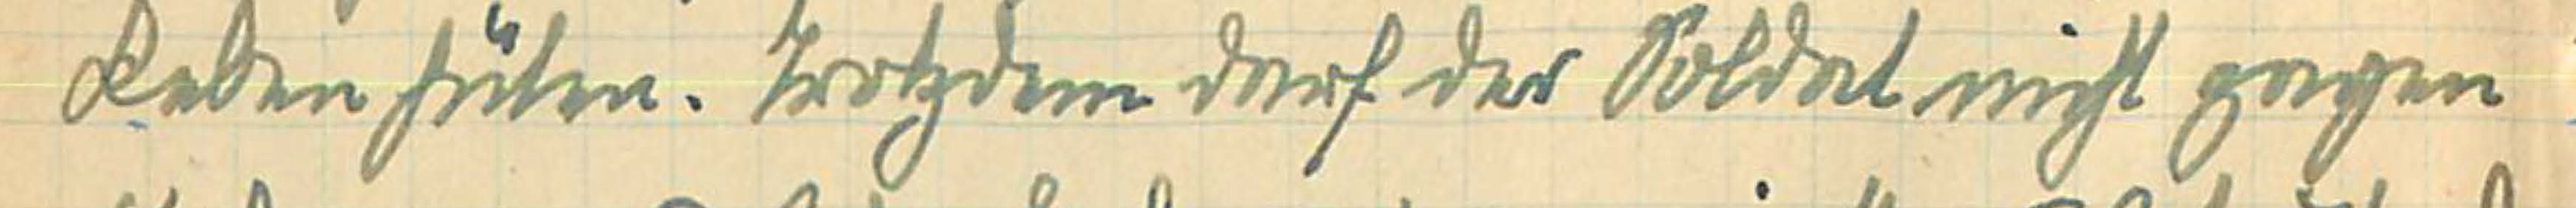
Leben hüten. Trotzdem darf der Soldat nicht zagen
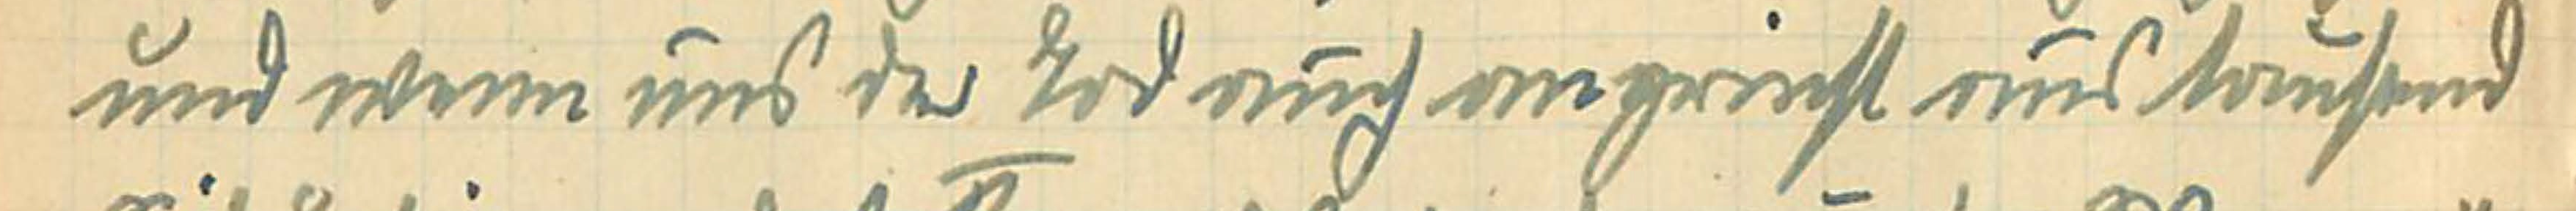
und wenn uns der Tod auch angrinst aus tausend
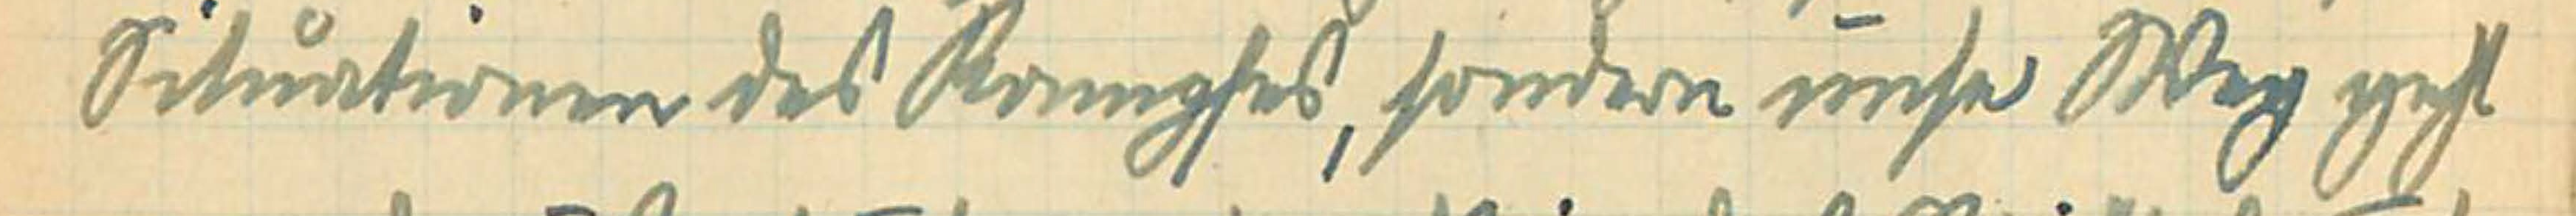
Situationen des Kampfes, sondern unser Weg geht
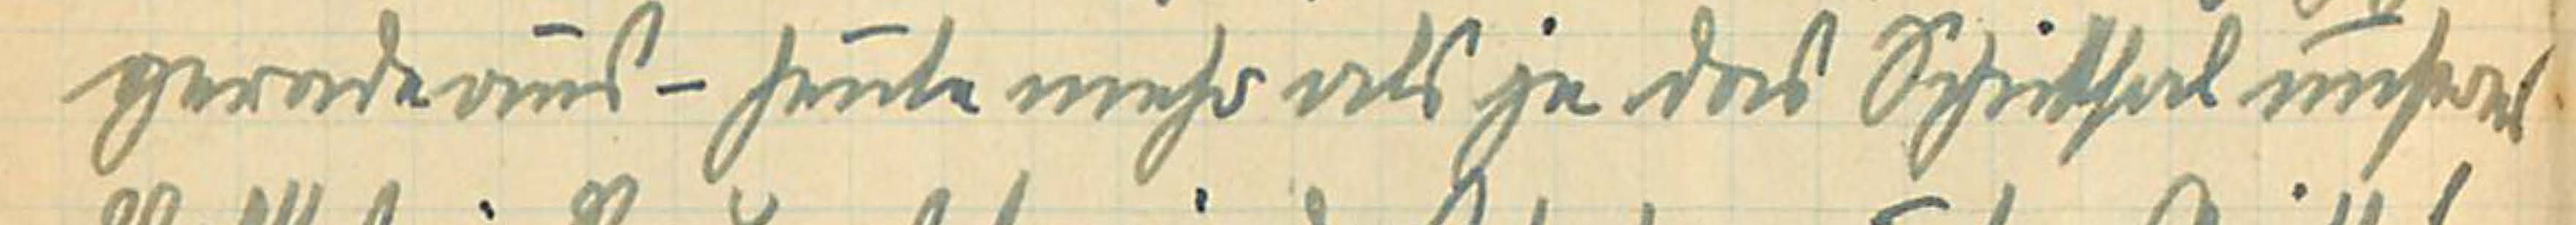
geradeaus – heute mehr als je das Schicksal unseres
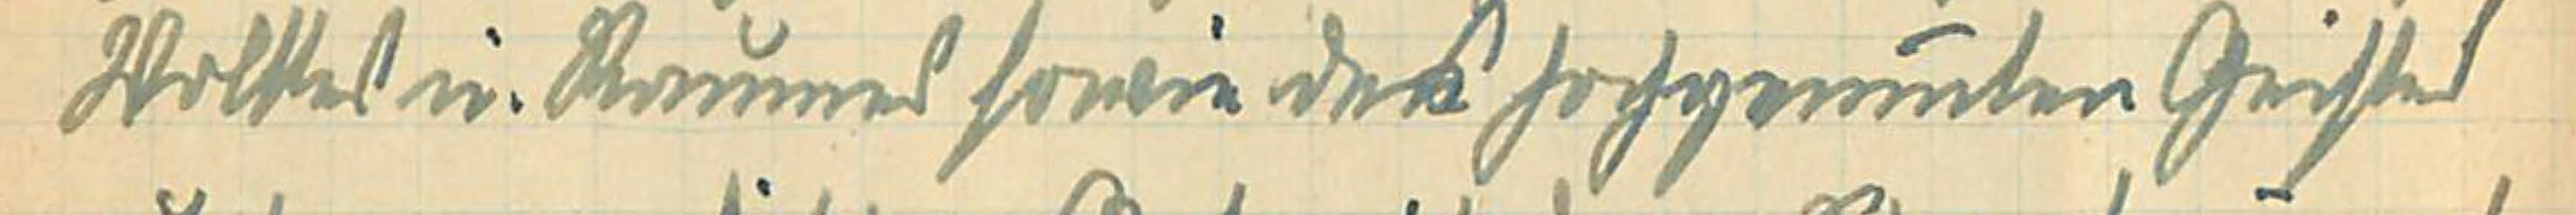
Volkes u. Raumes sowie des hochgemuten Geistes
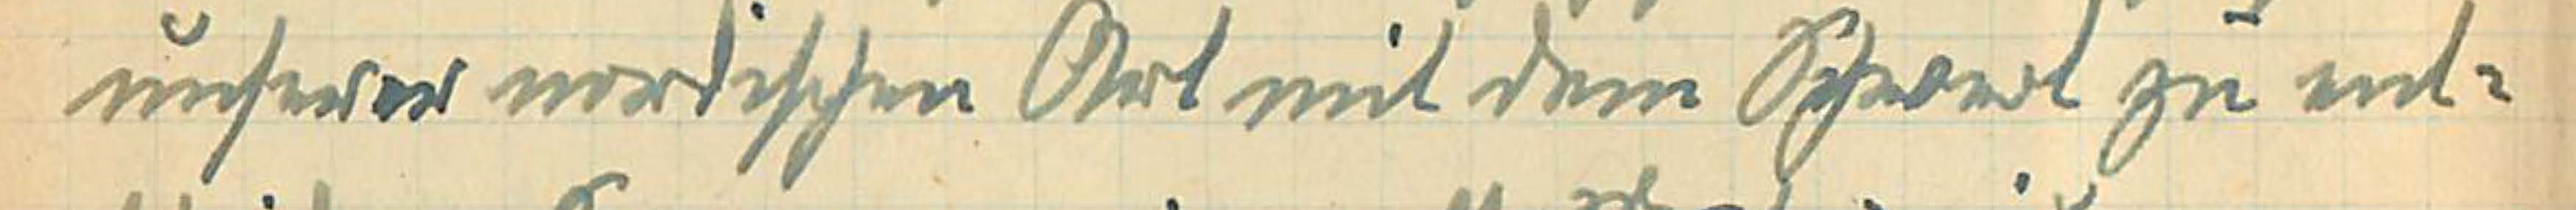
unserer nordischen Art mit dem Schwert zu ent-
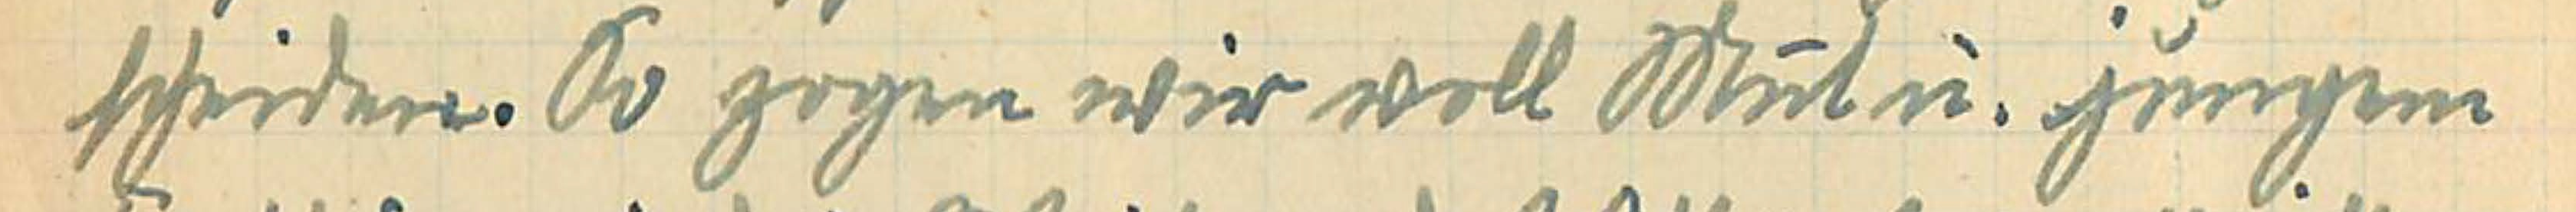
scheiden. So zogen wir voll Mut u. jungem
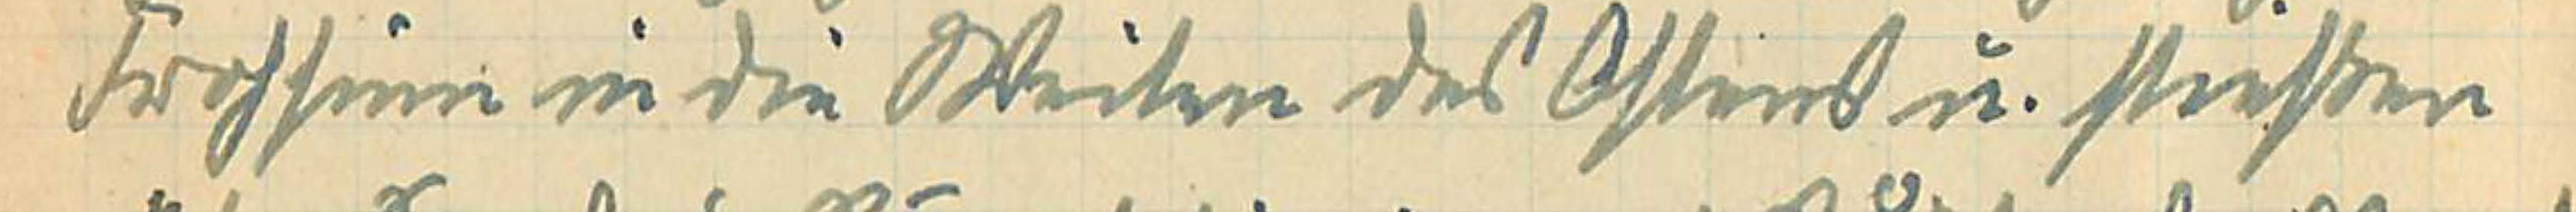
Frohsinn in die Weiten des Ostens u. stießen
